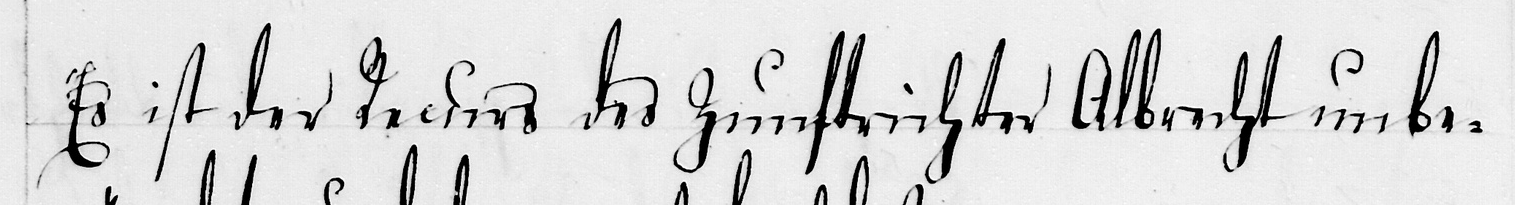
Es ist der Recurs des Zunftrichter Albrecht unbe¬
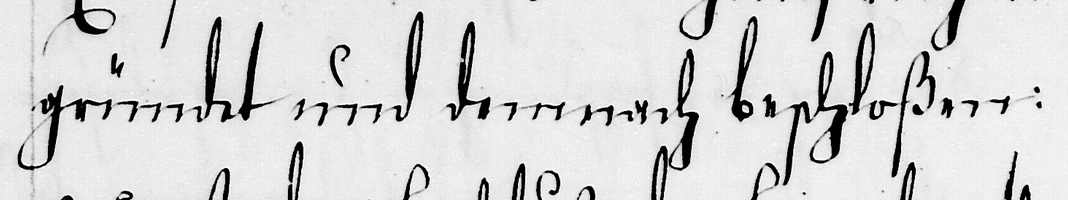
gründet und demnach beschloßen:
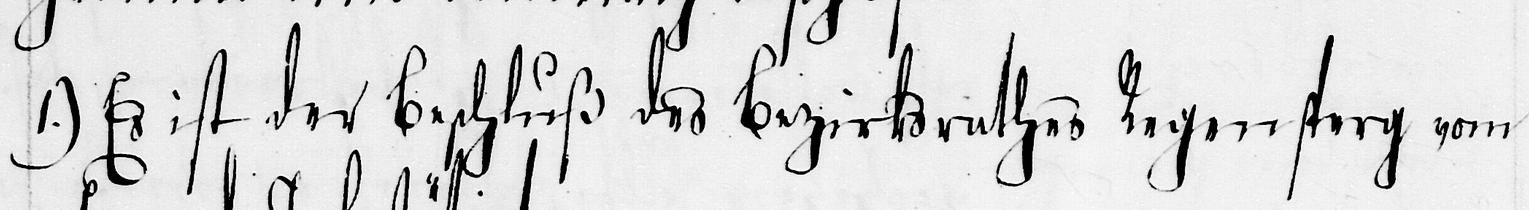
1.) Es ist der Beschluß des Bezirksrathes Regensperg vom
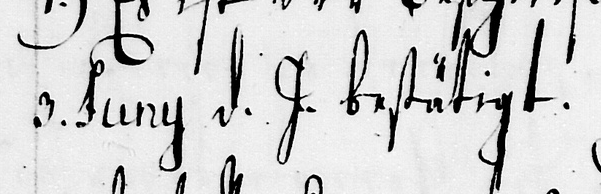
Juny d. J. bestätigt.
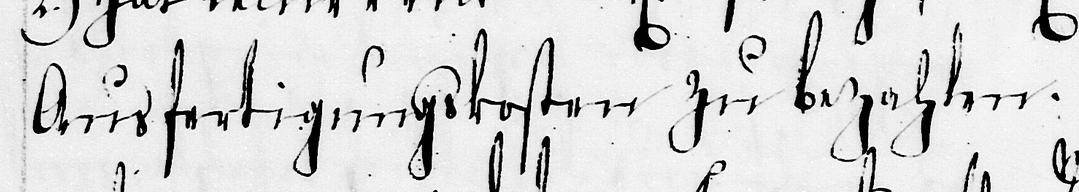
Ausfertigungskosten zu bezahlen.
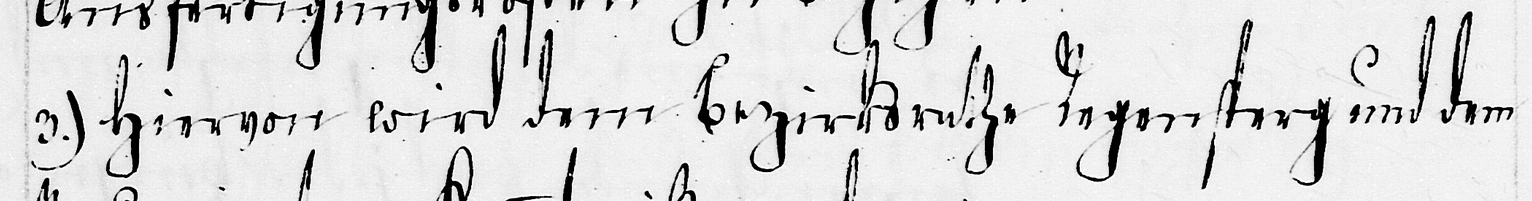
3.) Hiervon wird dem Bezirksrathe Regensperg und dem
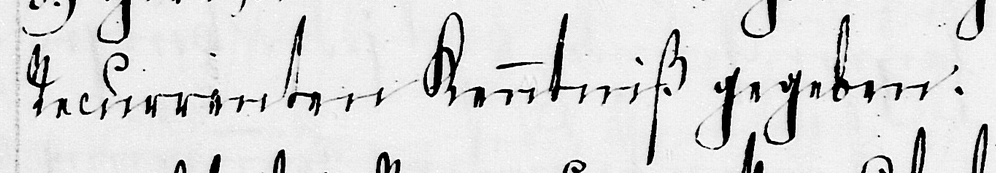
Recurrenten Kenntniß gegeben.
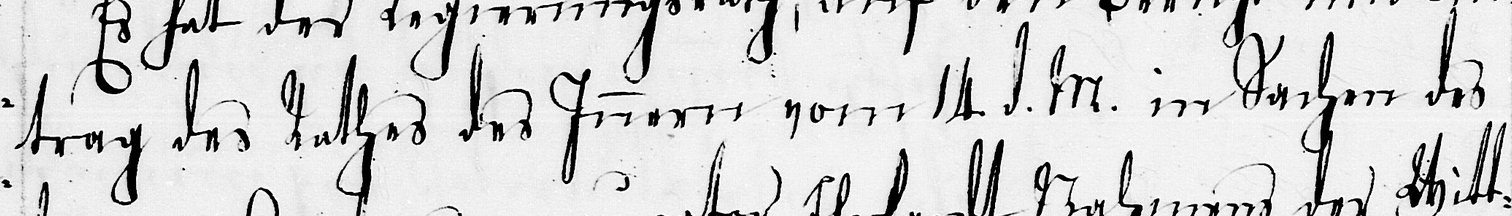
trag des Rathes des Innern vom 14. d. M. in Sachen des
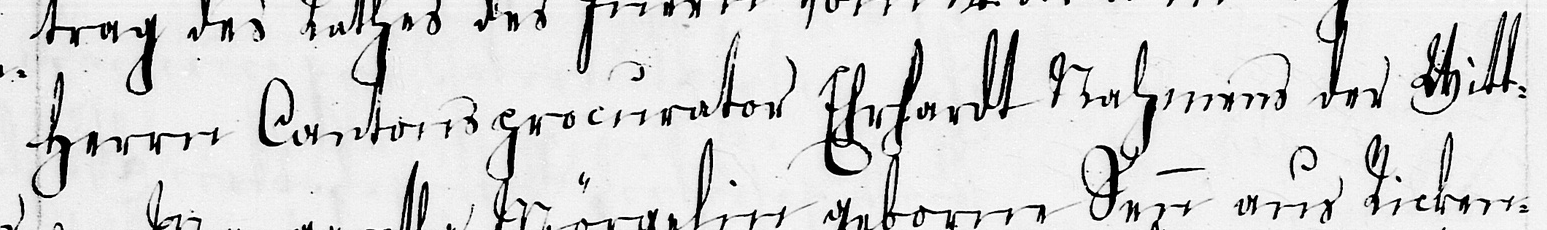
Herrn Cantonsprocurator Ehrhardt Nahmens der Witt¬
